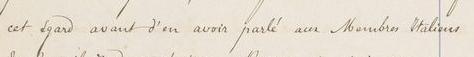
cet égard avant d'en avoir parlé aux Membres Italiens
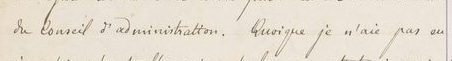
du Conseil d'administration. Quoique je n'aie pas eu
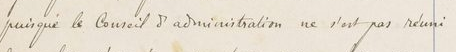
puisque le Conseil d'administration ne s'est pas réuni
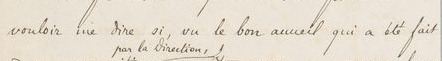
vouloir me dire si, vu le bon accueil qui a été fait
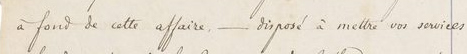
à fond de cette affaire, – disposé à mettre vos services
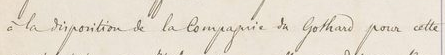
à la disposition de la Compagnie du Gothard pour cette
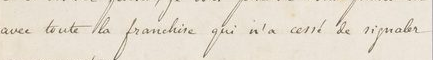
avec toute la franchise qui n'a cessé de signaler
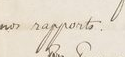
nos rapports.
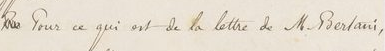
Ba Pour ce qui est de la lettre de M. Bertani,
